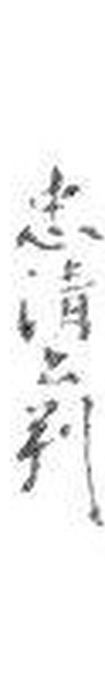忠清書判
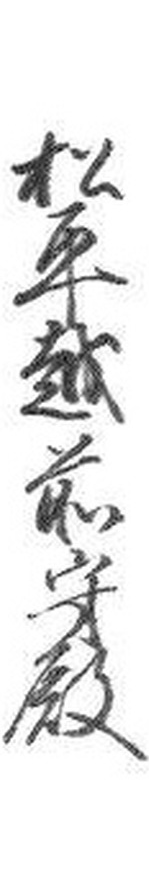松平越前守殿
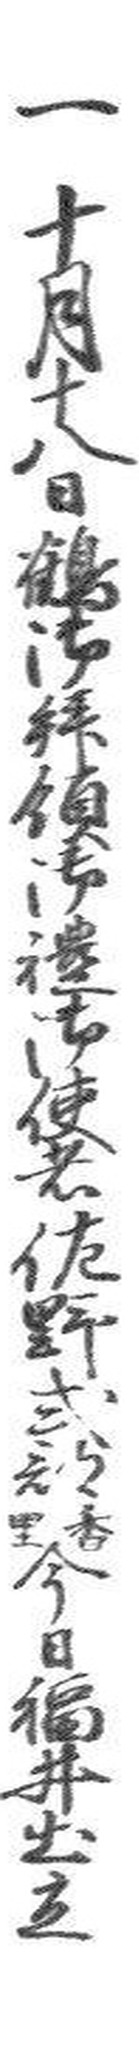一十月十八日鶴御拝領御礼御使者佐野式部香里今日福井出立
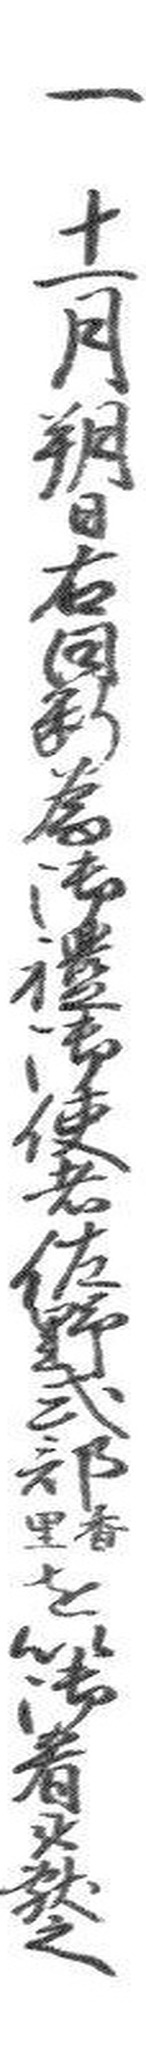一十一月朔日右同断為御礼御使者佐野式部香里を以御肴被献之
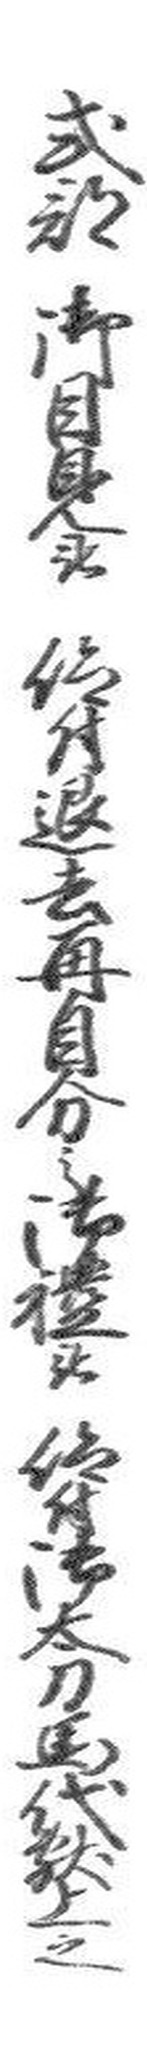式部御目見被仰付退去再自分之御礼被仰付御太刀馬代献上之
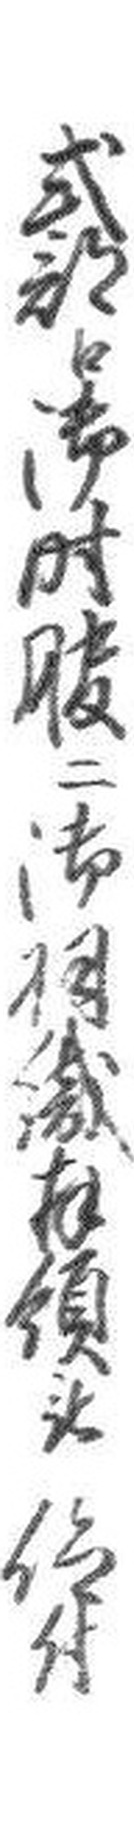式部江御時服二御羽織拝領被仰付
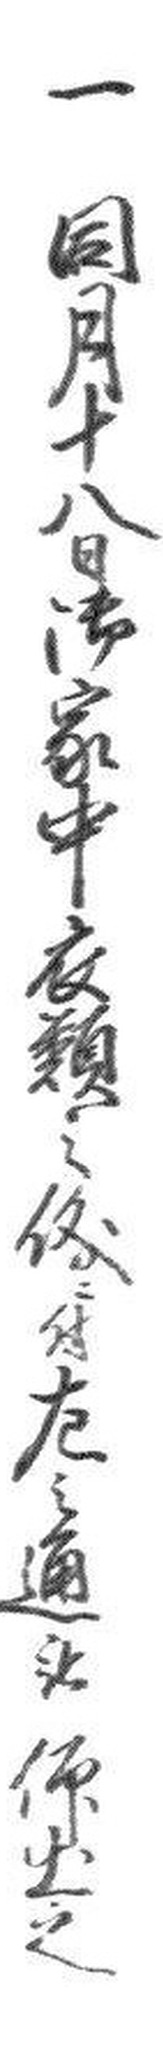一同月十八日御家中衣類之儀ニ付左之通被仰出之
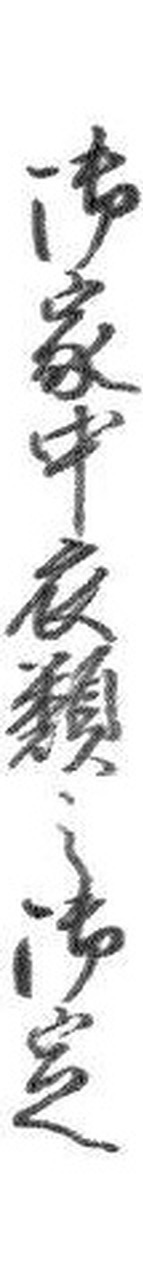御家中衣類之御定
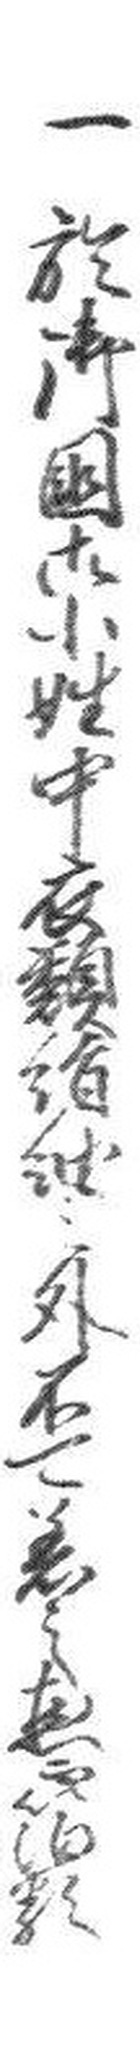一於御国御小姓中衣類絹紬之外不可着之惣而箔類
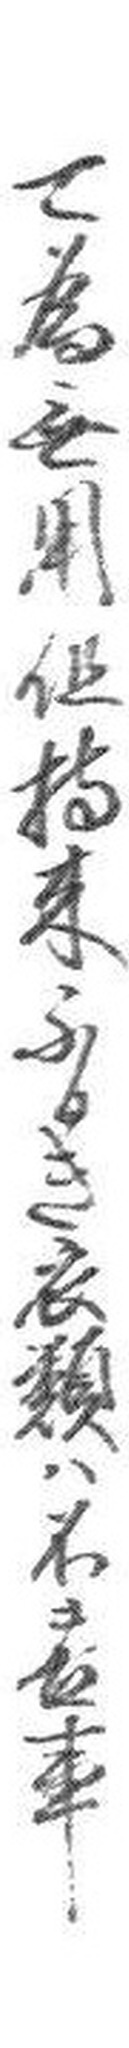可為無用但持来ふるき衣類は不事
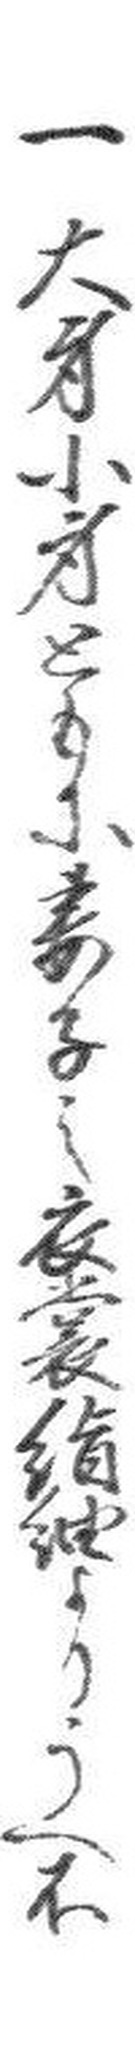一大身小身ともに妻子之衣裳絹紬よりうへ不

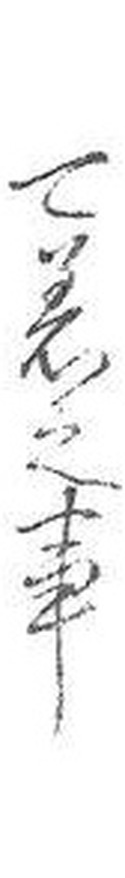可着之事
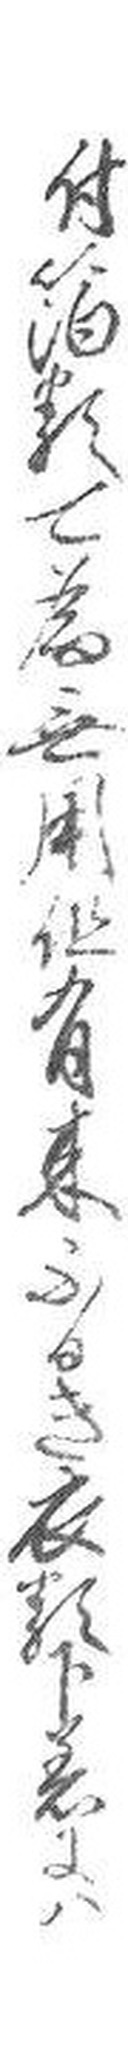付箔類可為無用但有来ふるき衣類下着には
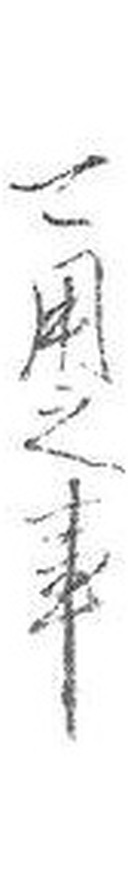可用之事
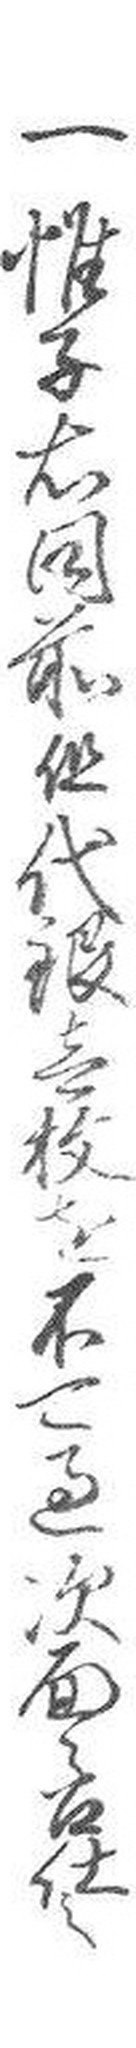一帷子右同前但代銀壱枚を不可過次面々召仕之
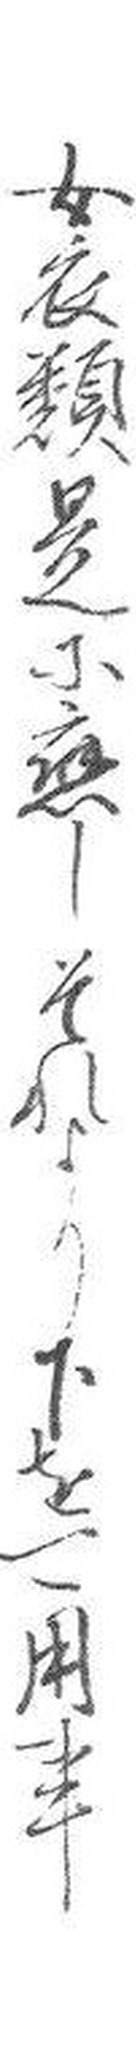女衣類是に応しそれより下を可用事
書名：家譜 六 光通公 従万治三年到寛文三年
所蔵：福井県文書館 Fukui Prefectural Archives
